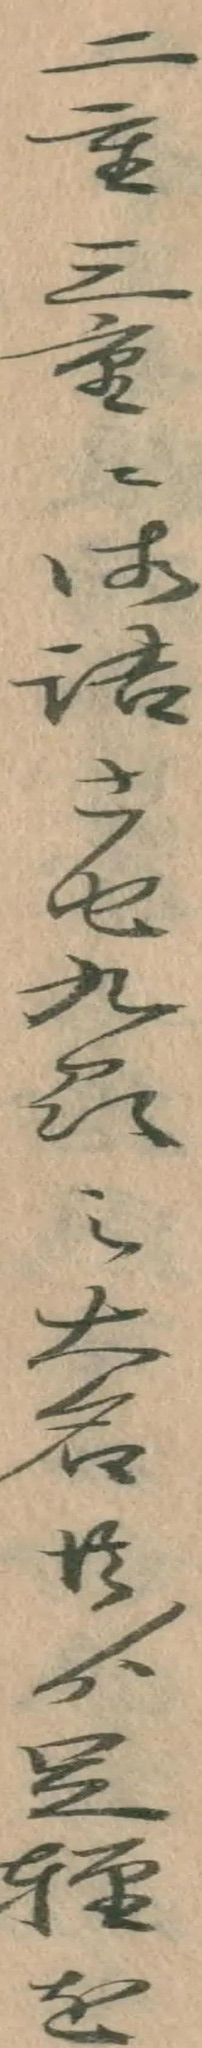二重三重に御詰させ九州之大名共ゟ足軽を
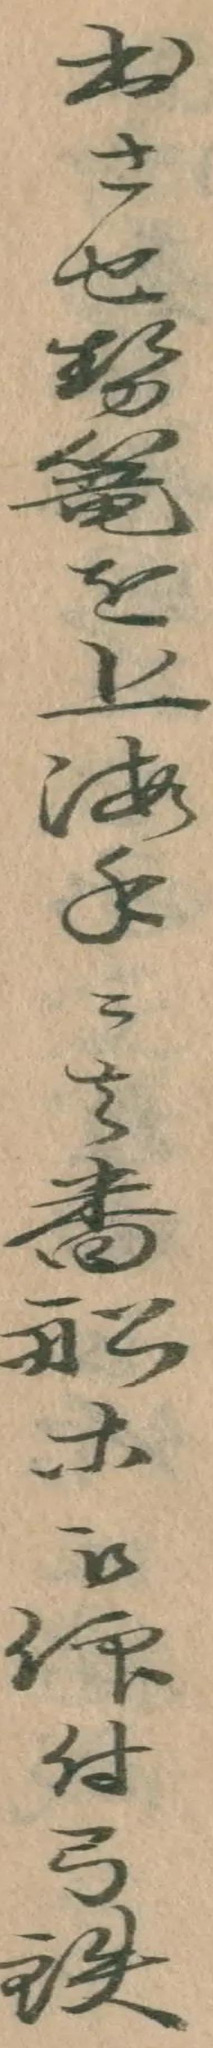出させ勢篭を上海手に者番舩等被仰付弓鉄
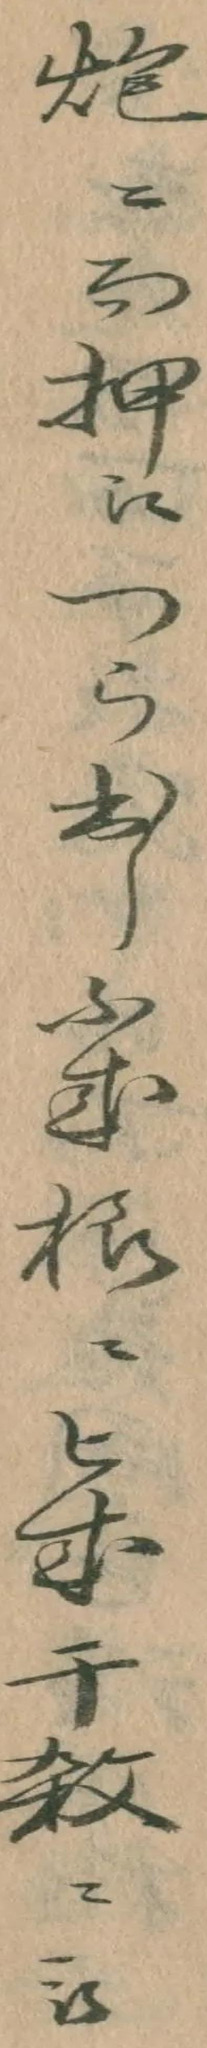炮に而押江つら出しふ成様に被成干殺に被
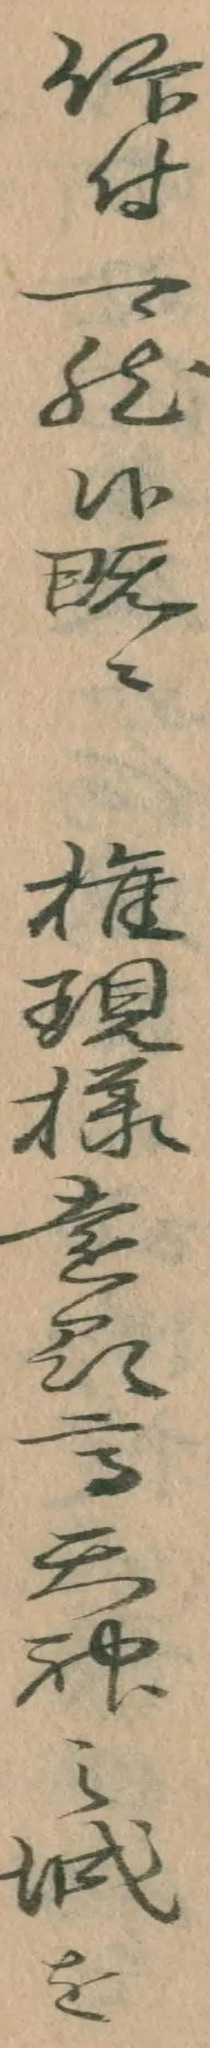仰付可然候既に権現様遠尋高天神之城を
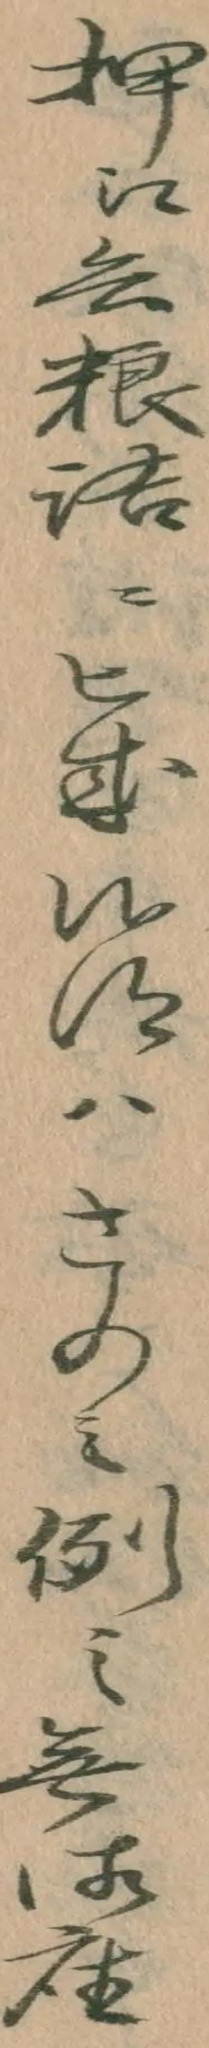押江兵粮詰に被成候得はさのみ例之無御座
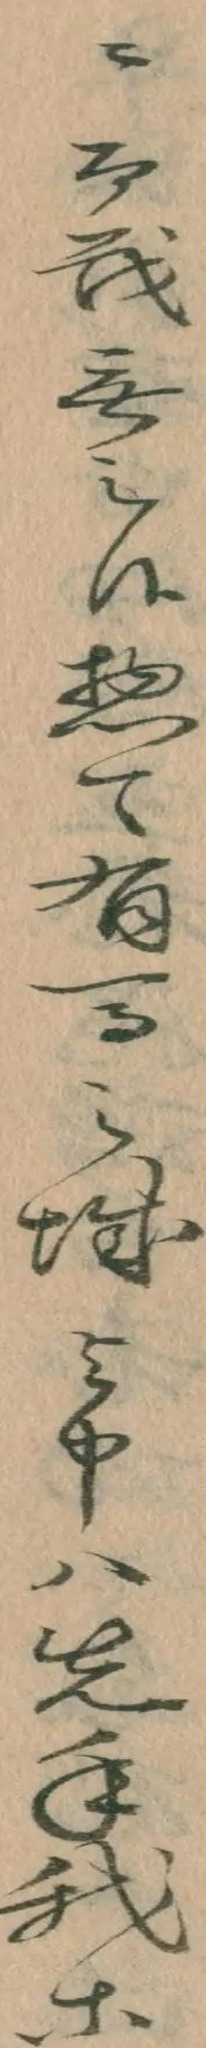に而茂無之候惣て有馬之城与申は先手我等
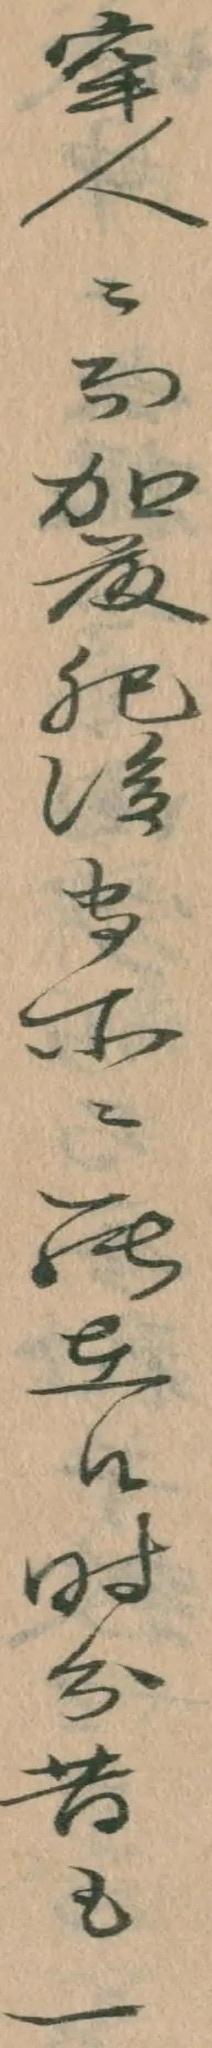牢人に而加藤肥後守所に罷在候時分昔も一
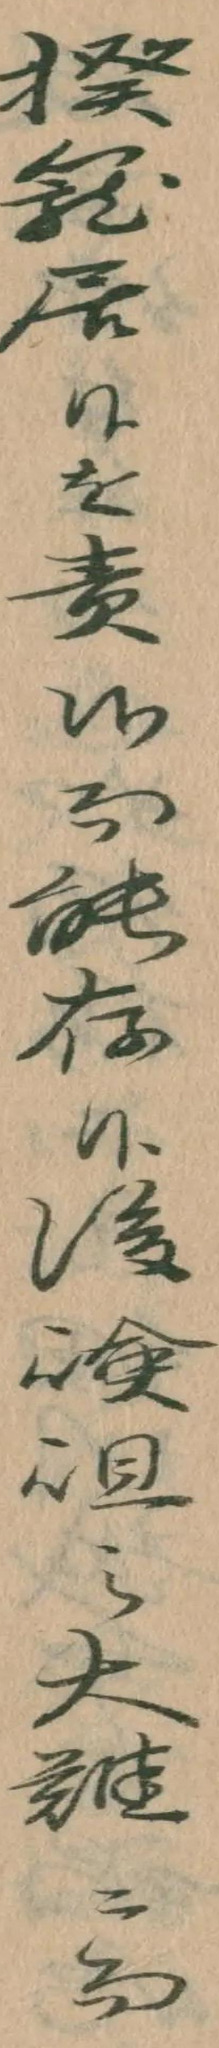揆籠居候を責候而能存候後嶮岨之大難に而
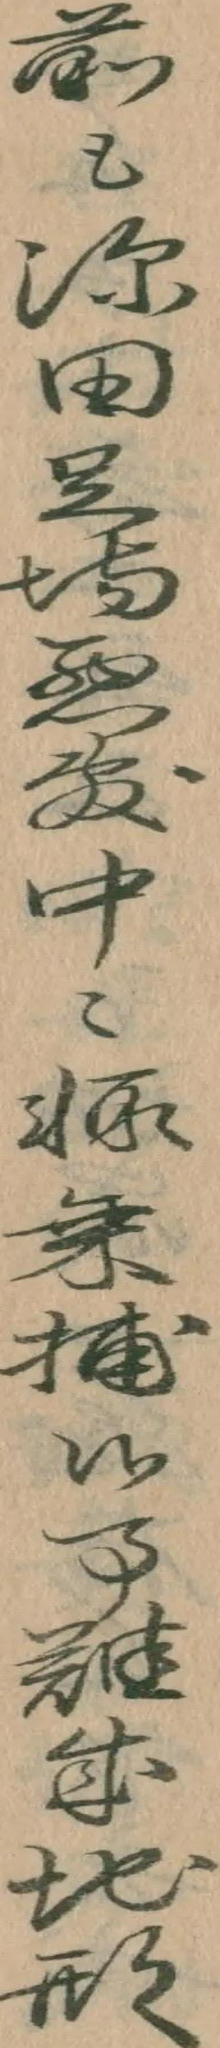前も深田足場悪敷中に輙乗捕候事難成地形
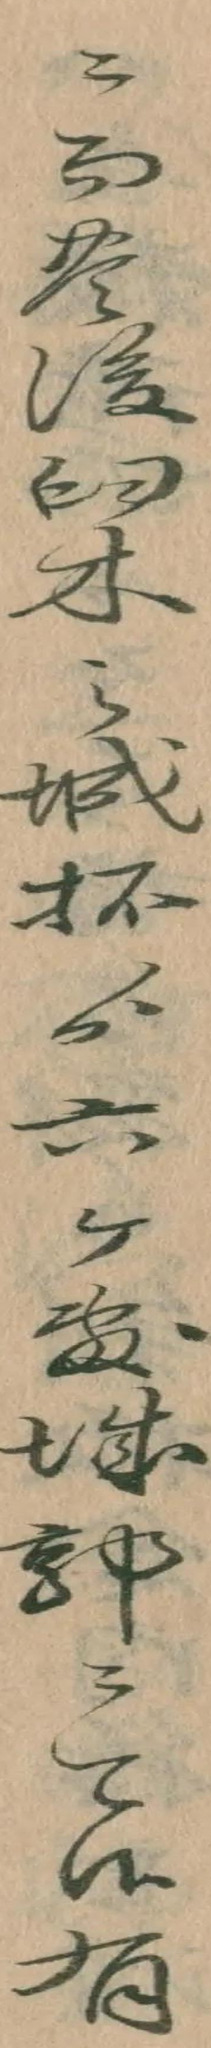に而豊後臼木之城抔ゟ六け敷城郭にて候有
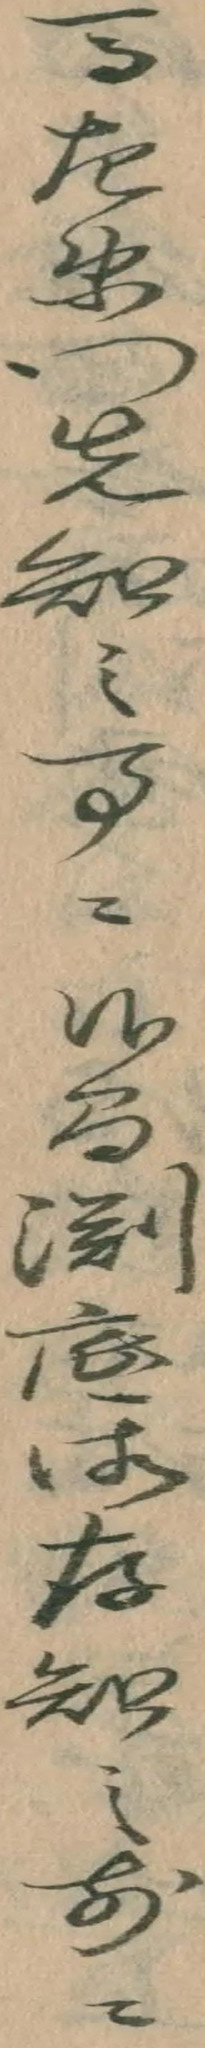馬左衛門先知之事に候間倒底御存知之前に
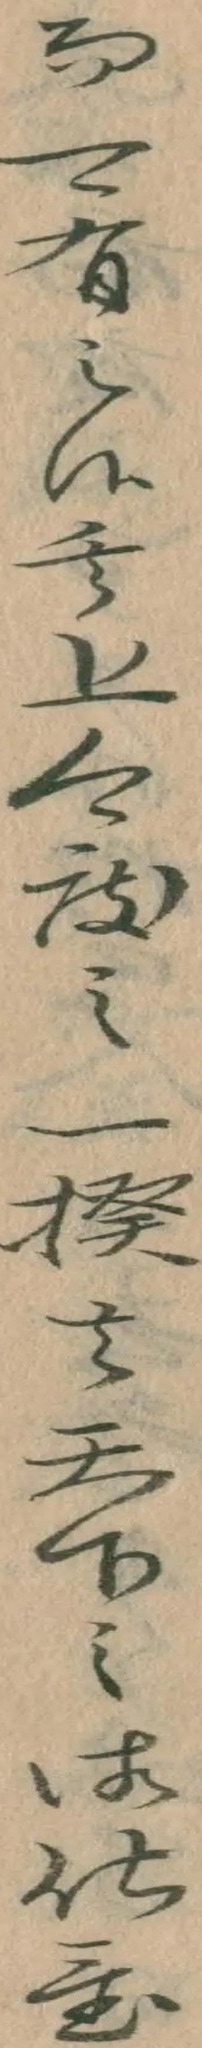而可有之候其上今度之一揆者天下之御仕置
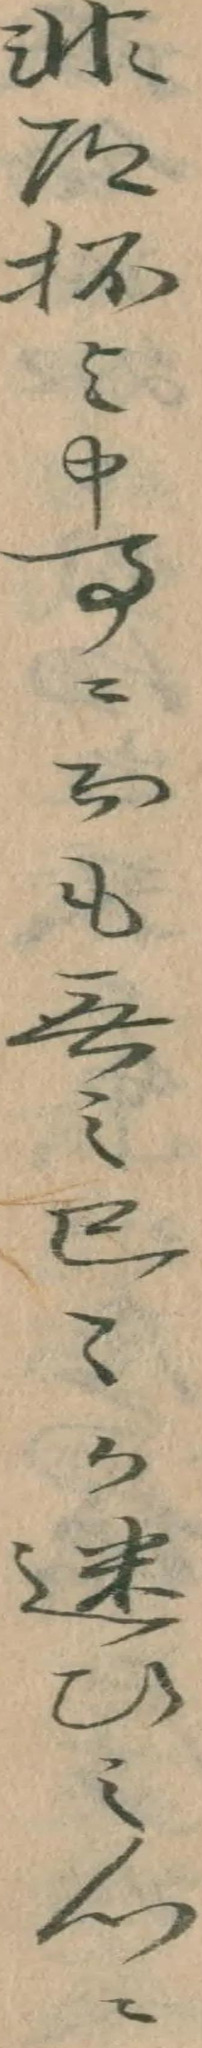非道抔与申事に而も無之已々か迷ひ之心に
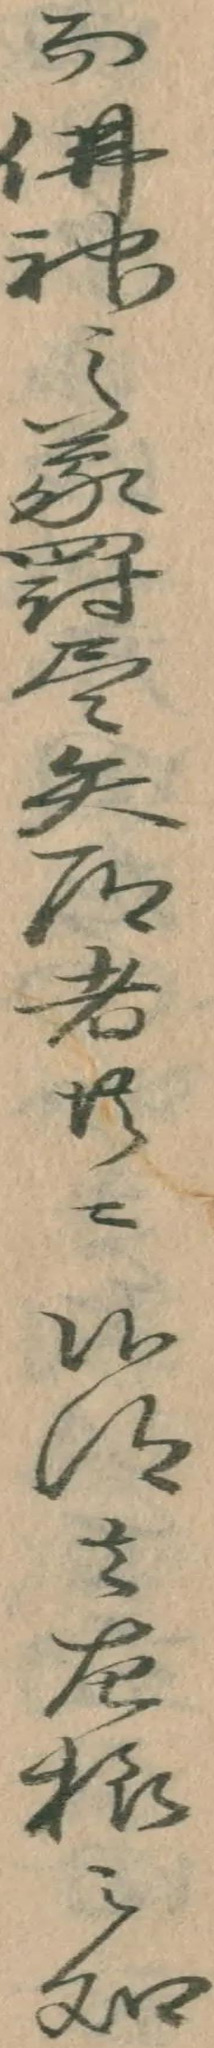而佛神之蒙罸尽矢道者共に候得者左様之処
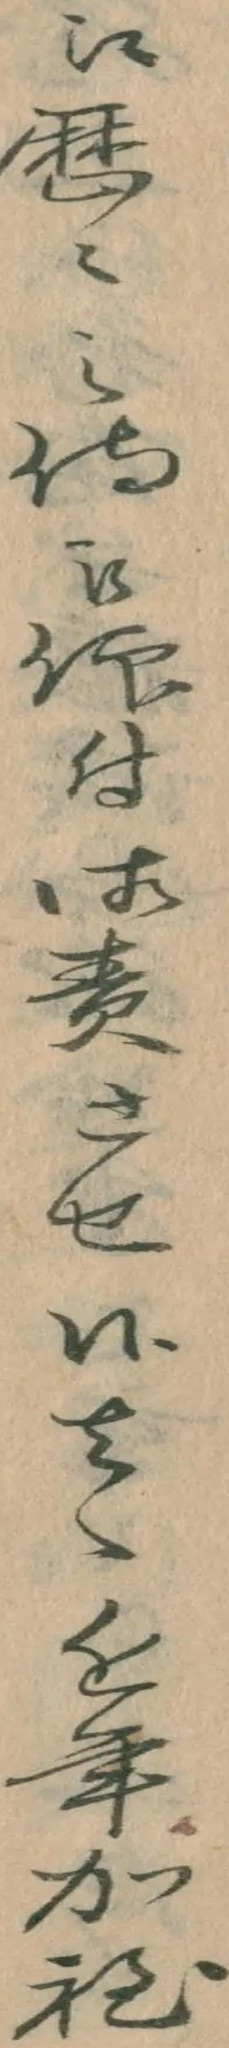江歴々之侍被仰付御責させ候者々近年加程
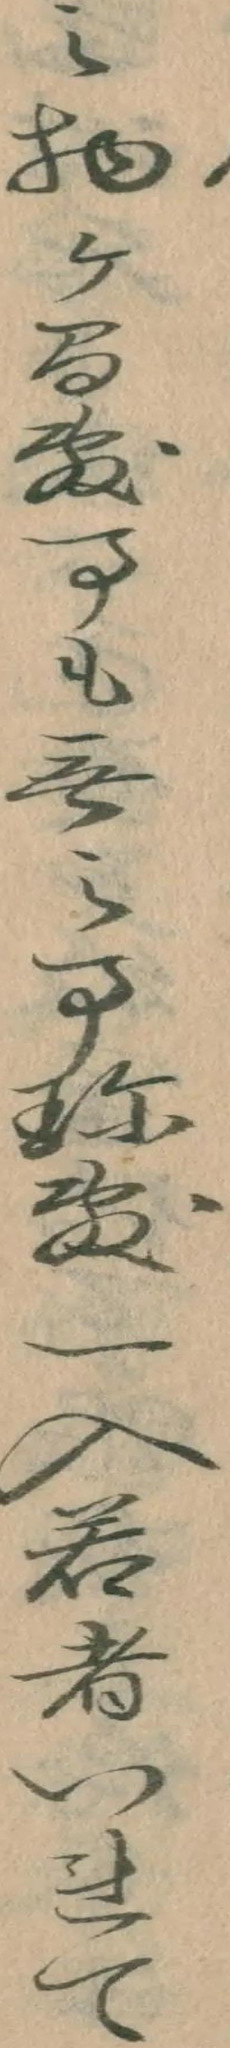之物け間敷事も無之事珎敷一入若者い連て
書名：切支丹御退治記 49巻. [7]
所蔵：国立国会図書館 National Diet Library, JAPAN
